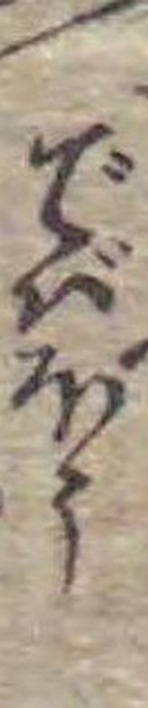でばほう
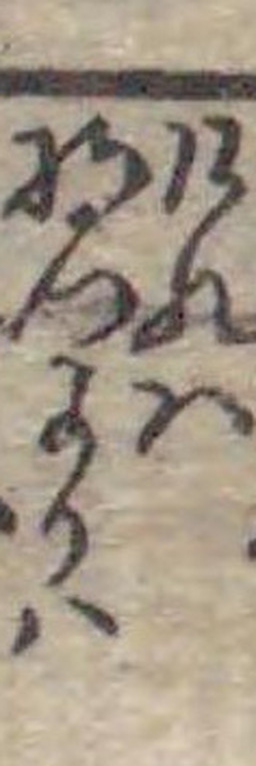将門よりは
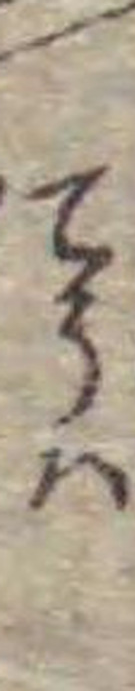てうは
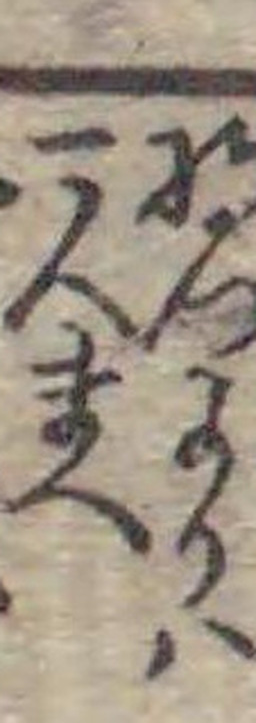一人まへ
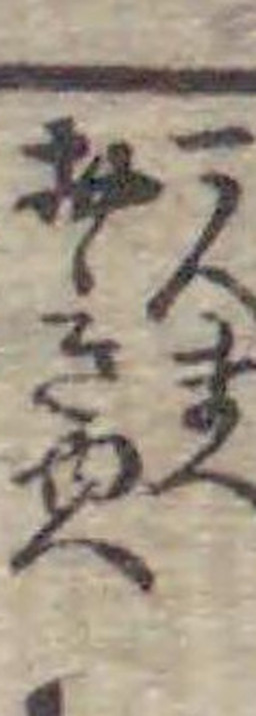おゝきゆへ
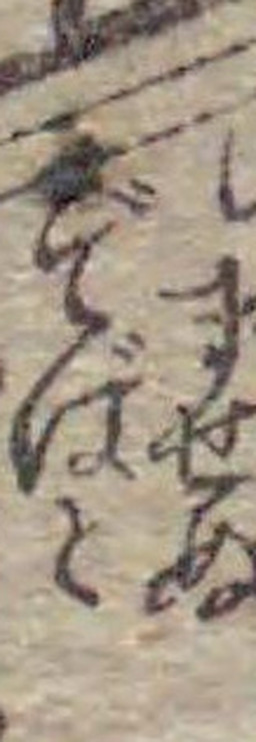でばと
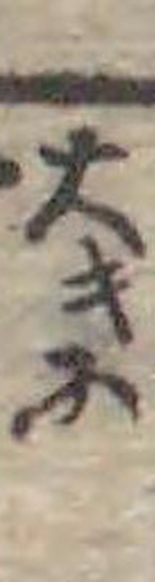大きに
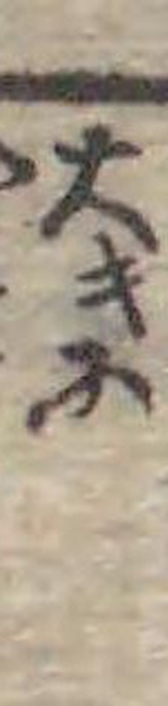大きに
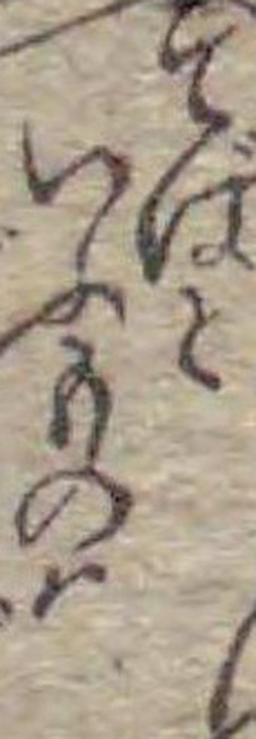いふものは
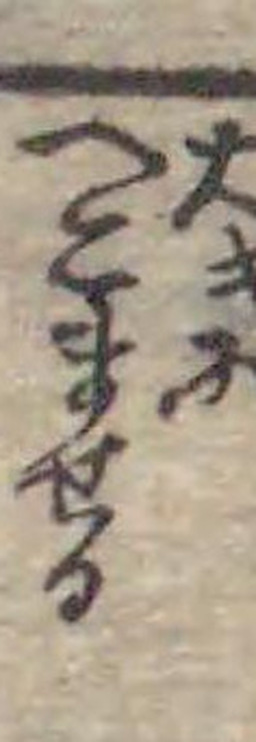へこませる
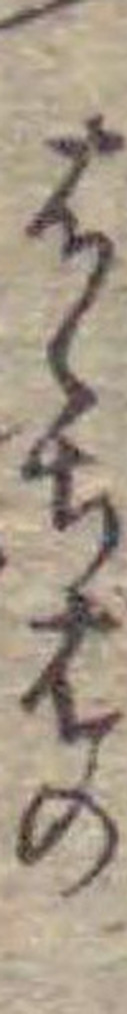ばゞちばの
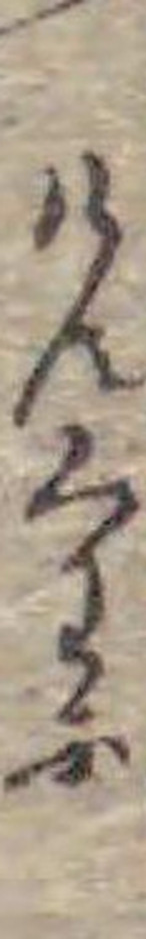けんくわに
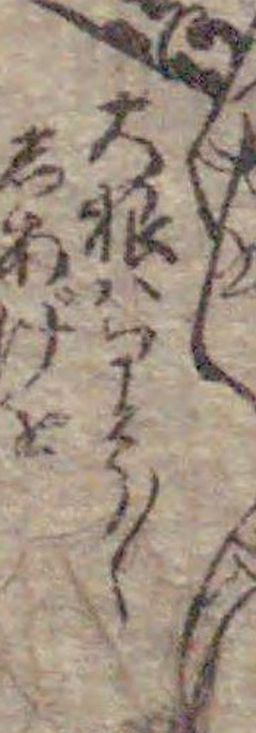大根はりう〳〵

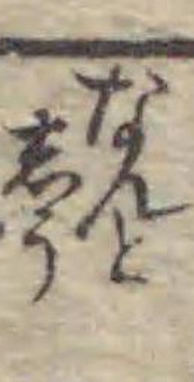なんと
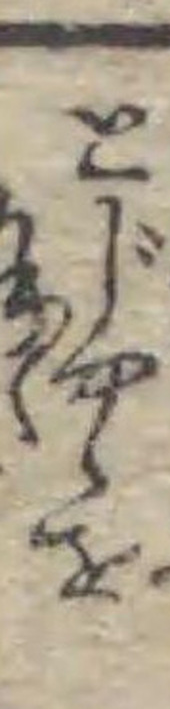とじやくを
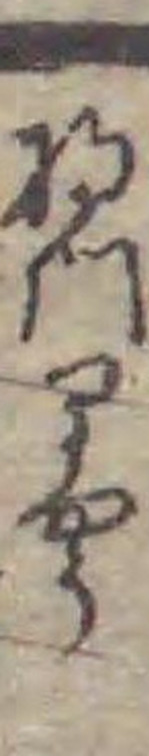将門りやう
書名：時代世話二挺皷 : 2巻
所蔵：国立国会図書館 National Diet Library, JAPAN
